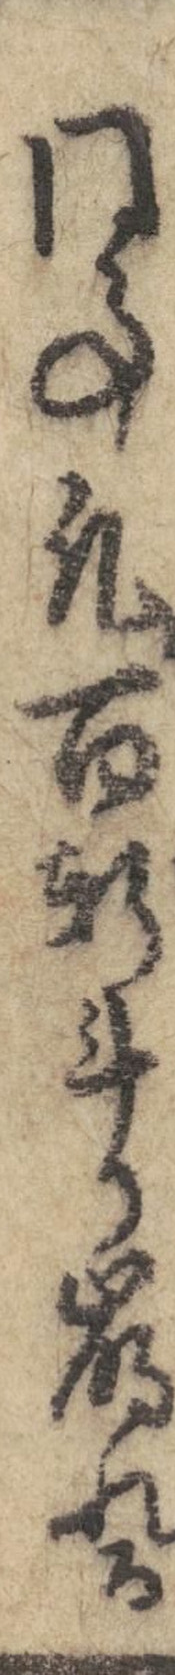同事凡百軒計り崩れる
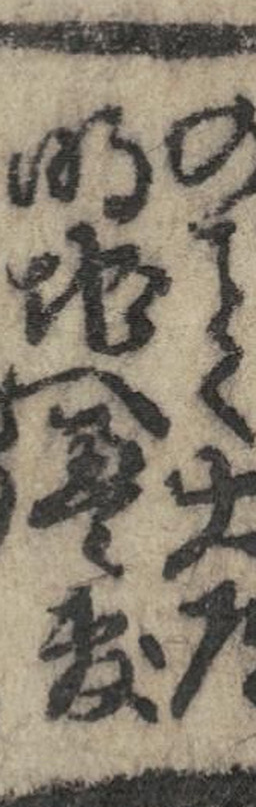明地へ畳敷
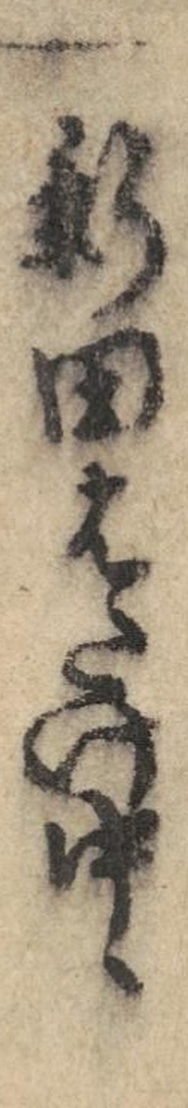新田はたけ中へ
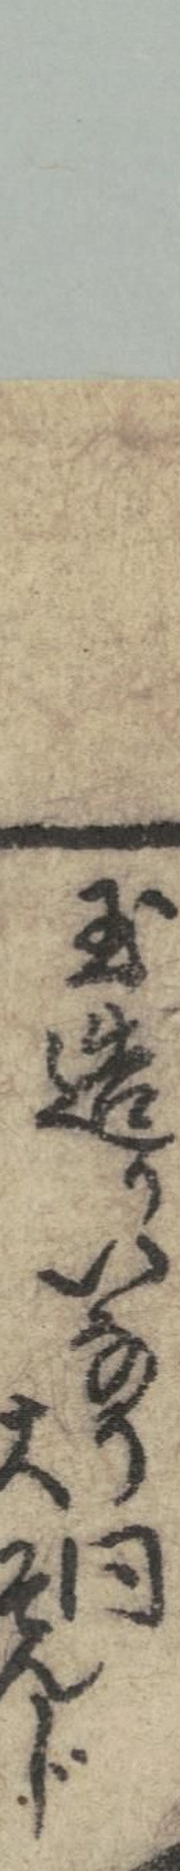玉造リいなり同
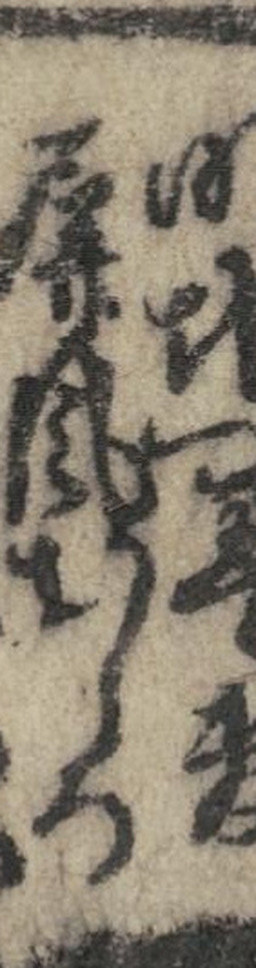屏風むしろ
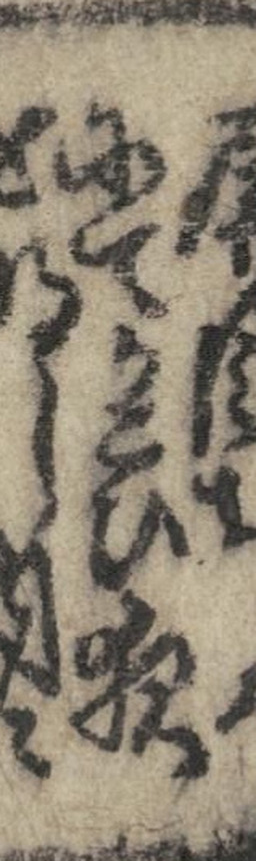にてかこひ夜
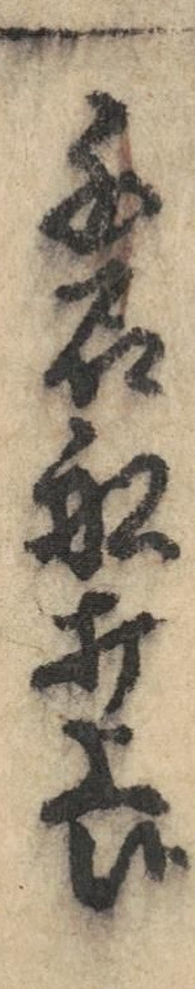千石舟打上候
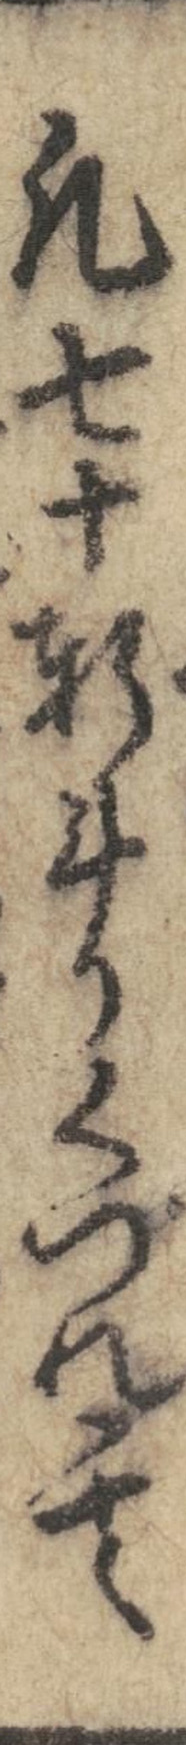凡七十軒計りくづれ其
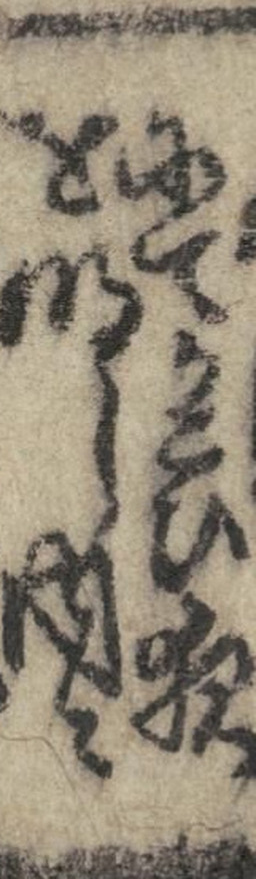を明し内〻
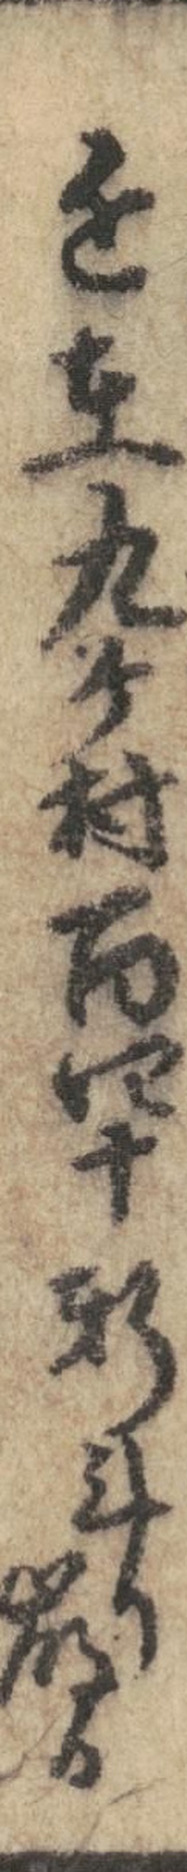近在九ケ村百四十軒計り崩る
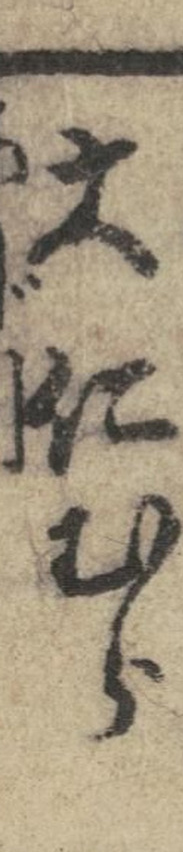大仁むら
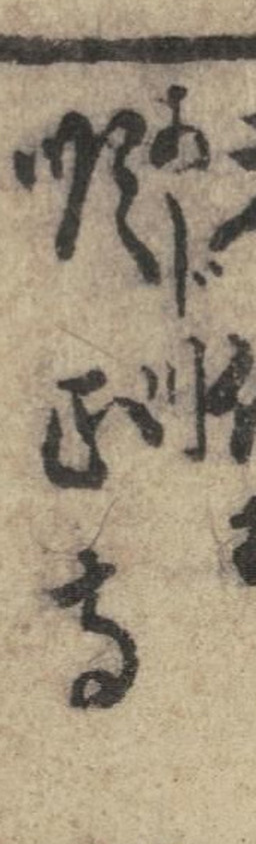順正寺
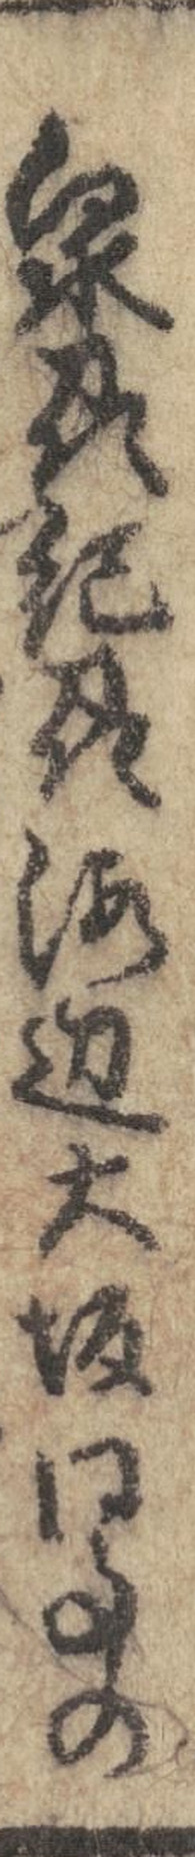泉州紀州河辺大坂同事の
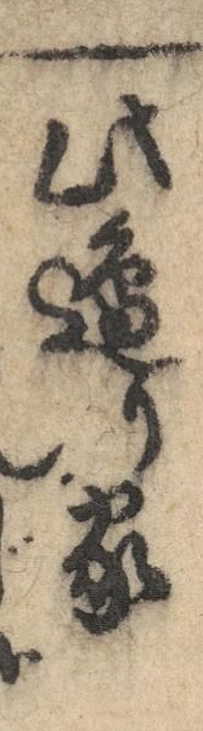此辺り家
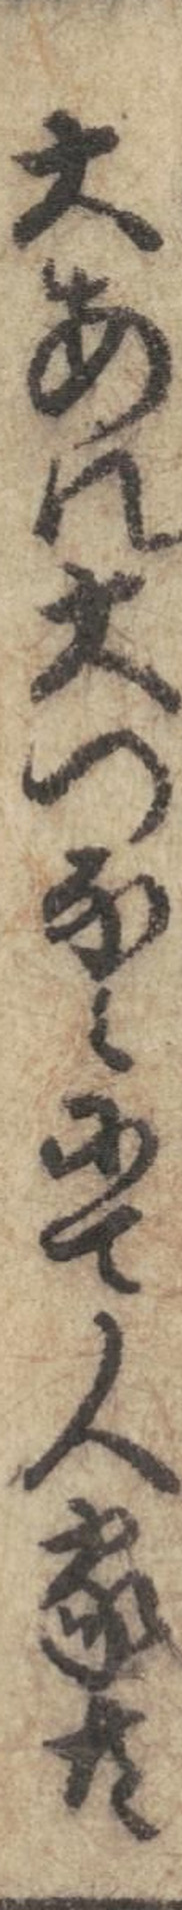大あれ大つなみにて人家共
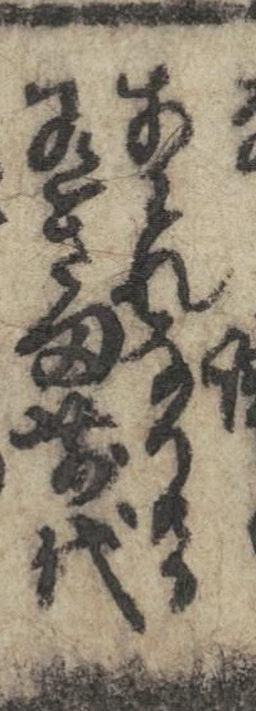有さま前代
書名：諸国大阪太地震大つなミ末代噺
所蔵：東京大学地震研究所図書室 Earthquake Research Institute Library, The University of Tokyo, JAPAN
